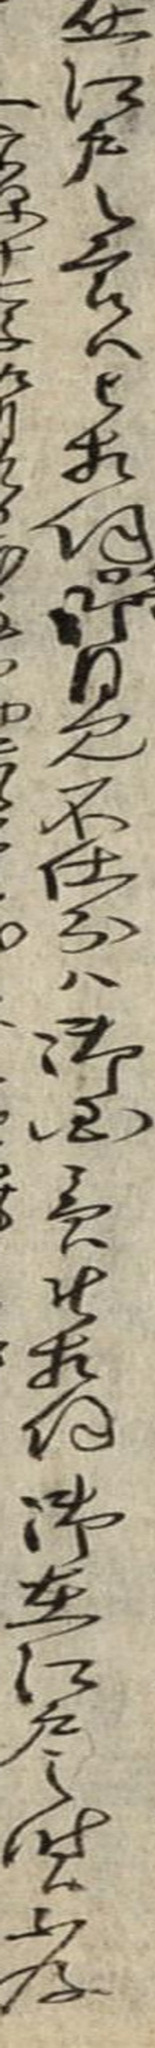達御耳御在江戸之節ハ被相伺筈御目見不仕分ハ御国ニ而ハ相伺御在江戸之時ハ不及
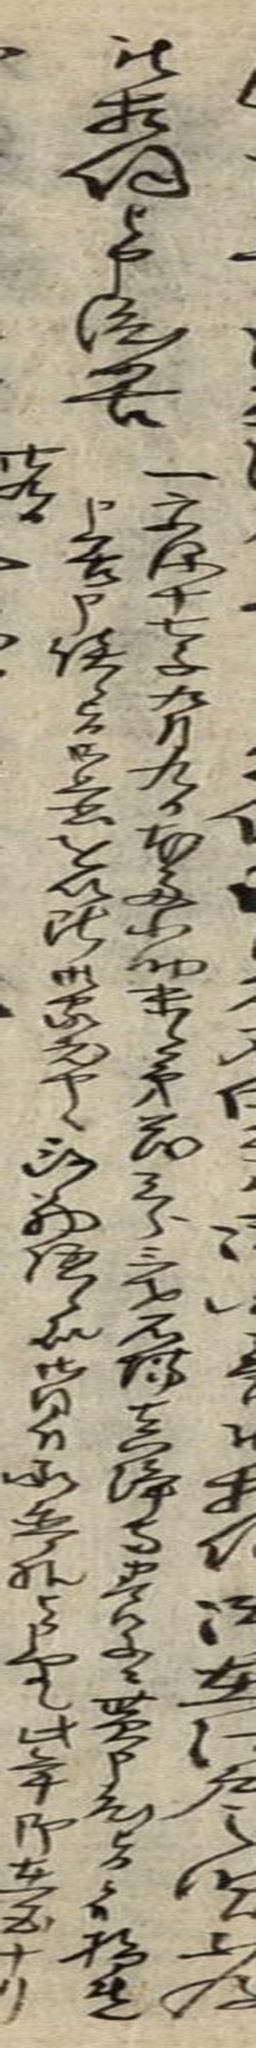申筈申談候旨口上書を以断御家老中へ致御物語候処御目付承置候様被申聞候此年御在国ナリ
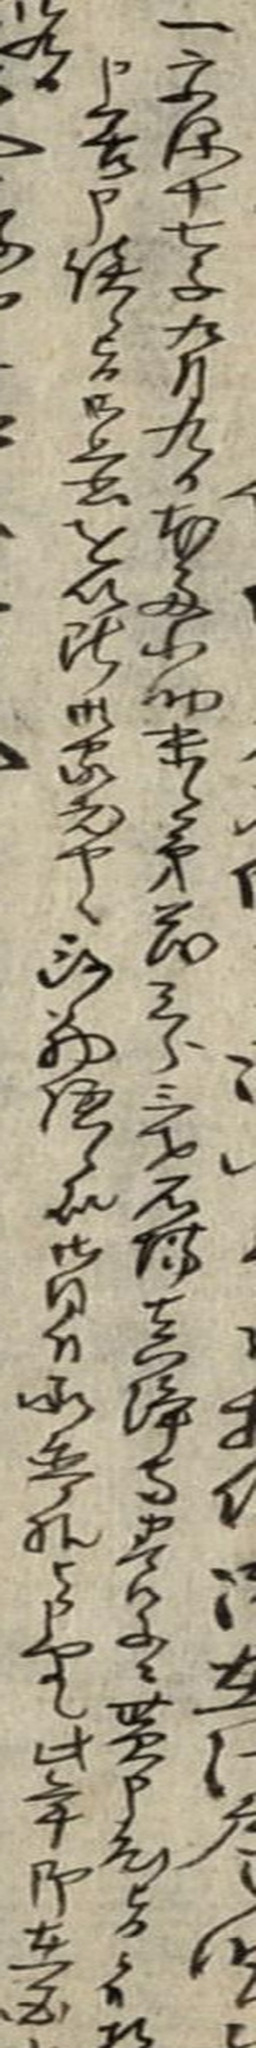申筈申談候旨口上書を以断御家老中へ致御物語候処御目付承置候様被申聞候此年御在国ナリ
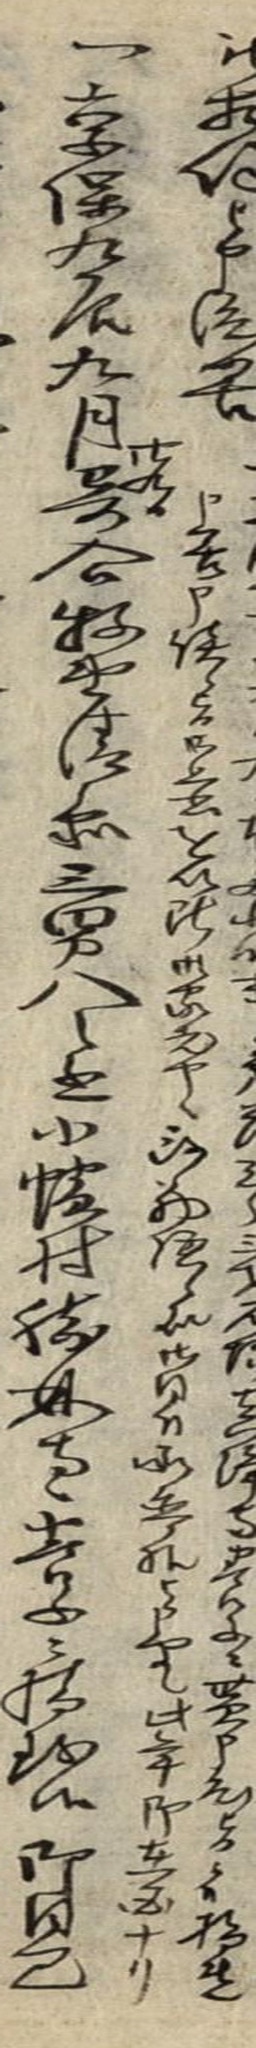一享保九辰九月廿九日寄合牧野清兵衛三男八之丞小幡村勝林寺へ養子ニ指越候御目見
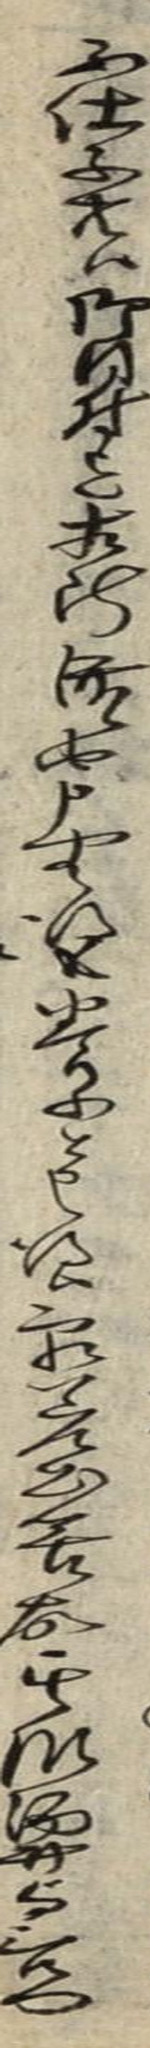不仕子共ハ御目付迄相断済候由申聞候得共養子と申候得ハ願差出筈故其段酒井与三左衛門
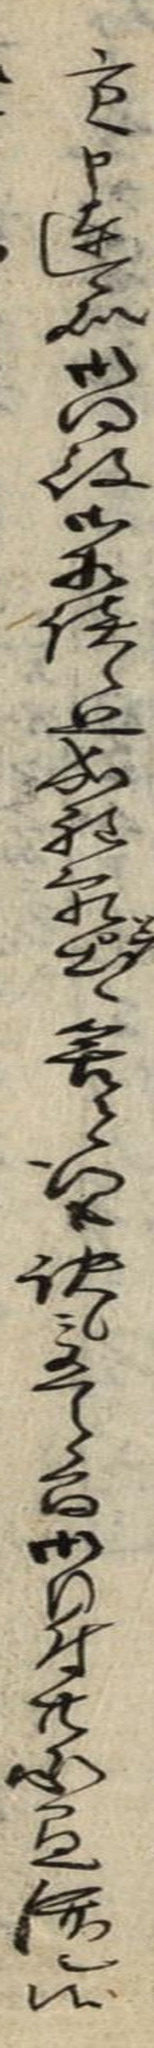方へ申達候処御同役御相談之上成程願差出候筈ニ候得共訳も有之候間御目付共承置済シ候
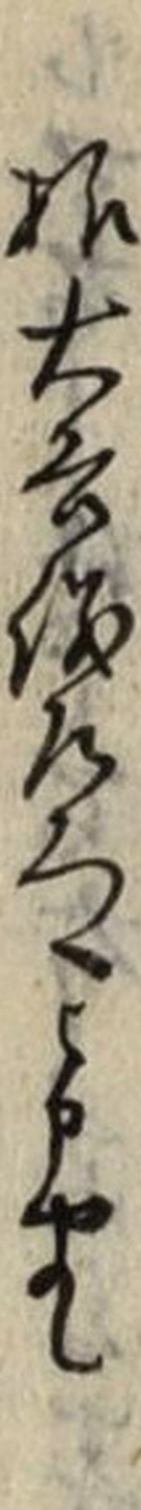様大谷儀左衛門へ被申聞候
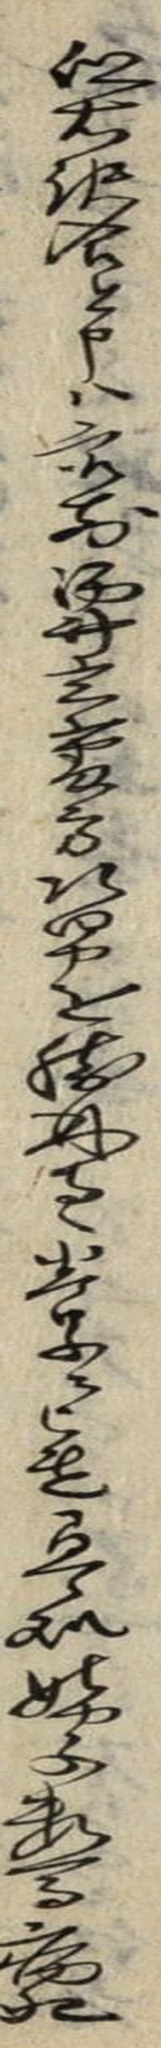但右訳合と申ハ最前酒井玄蕃方次男を勝林寺へ養子ニ被遣置候処嫡子数馬病死
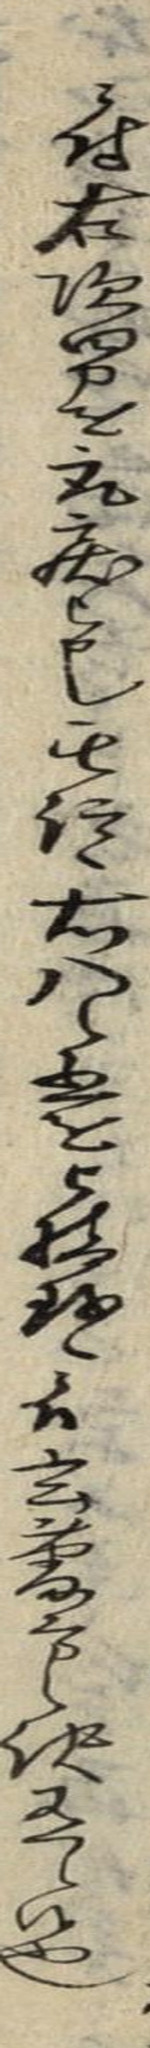ニ付右次男を取戻被申候其跡へ右八之丞を被指越候ニ付玄蕃方之訳有之候也
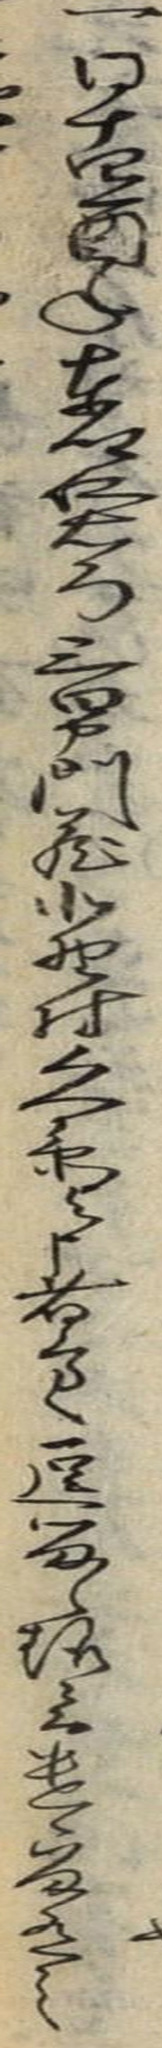一同十四酉年東郷仁右衛門三男門蔵北野村久兵衛与申者方へ逗留之趣ニ而遣候留有之
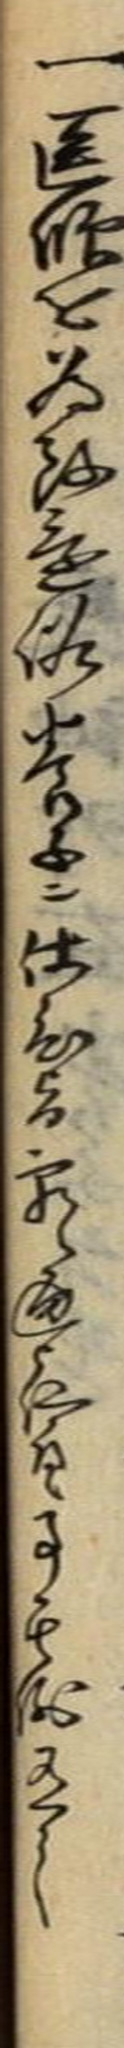一医師を為致還俗養子ニ仕度旨願之通被仰付候事其例有之
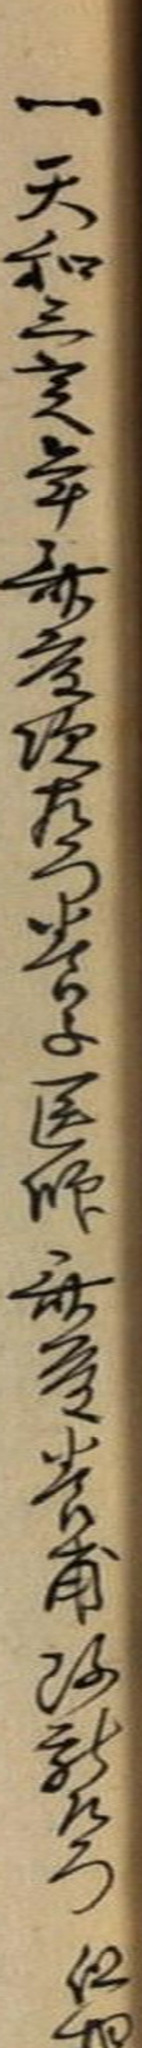一天和三亥年斎藤次左衛門養子医師斎藤養甫改新左衛門但甥
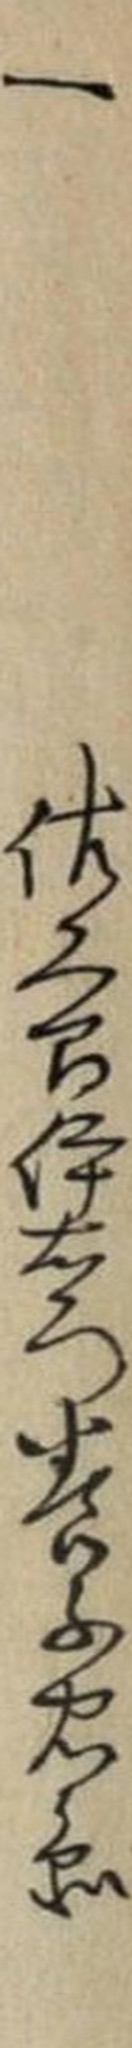一佐久間伊右衛門養子忠兵衛
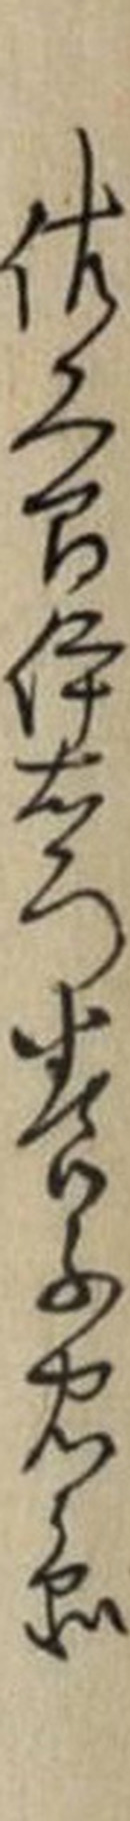一佐久間伊右衛門養子忠兵衛
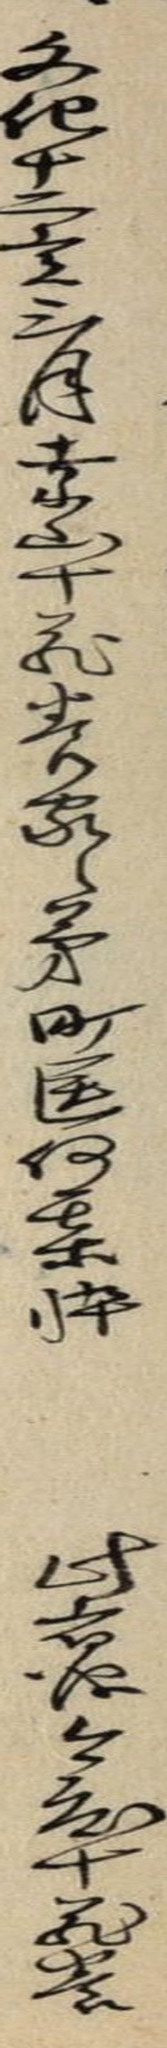一文化十二亥三月桑山十蔵養家之弟町医何某忰此者儀今度十蔵養
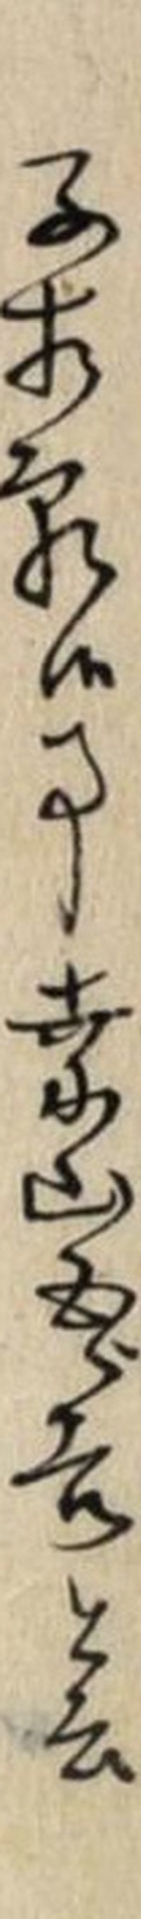子相願候事桑山五郎吉と云
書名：養子縁組之部
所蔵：福井県文書館 Fukui Prefectural Archives
